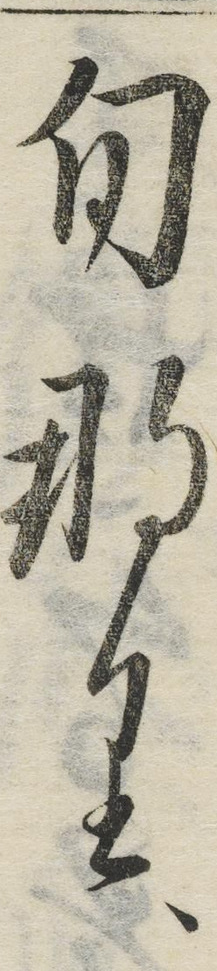旬なり、
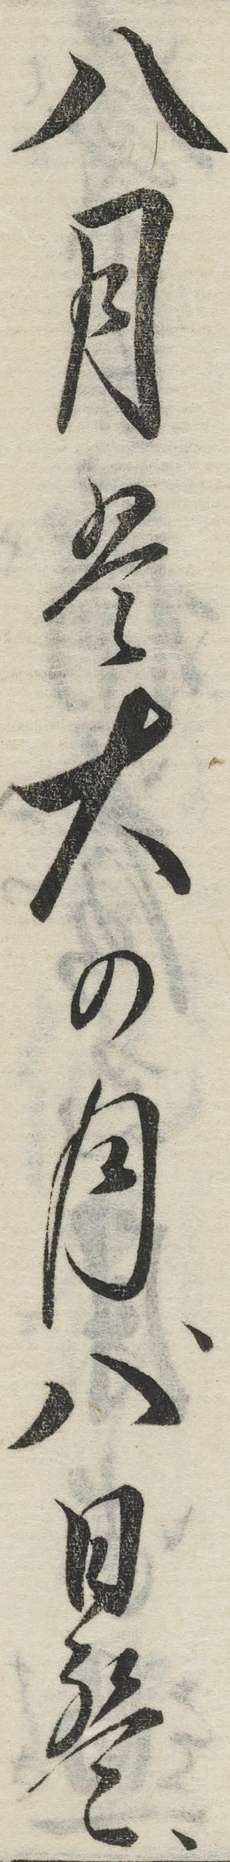八月は大の月、八日は、
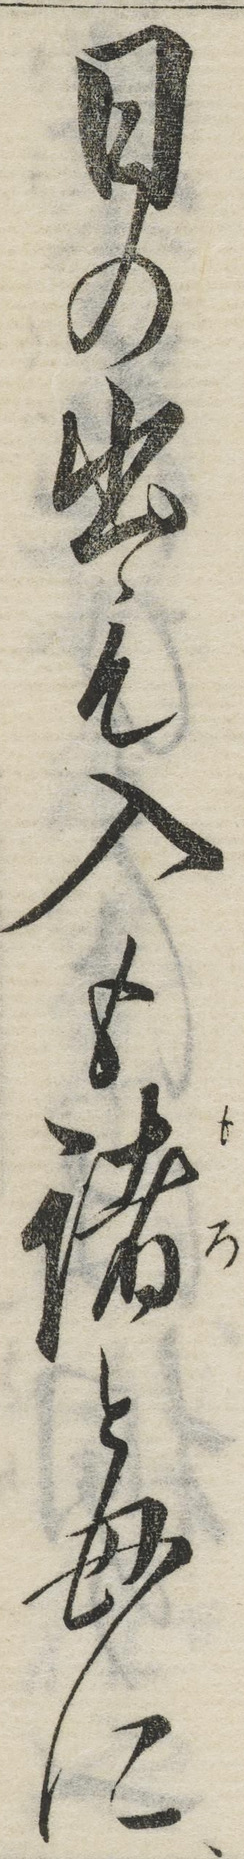日の出も入も諸ともに、
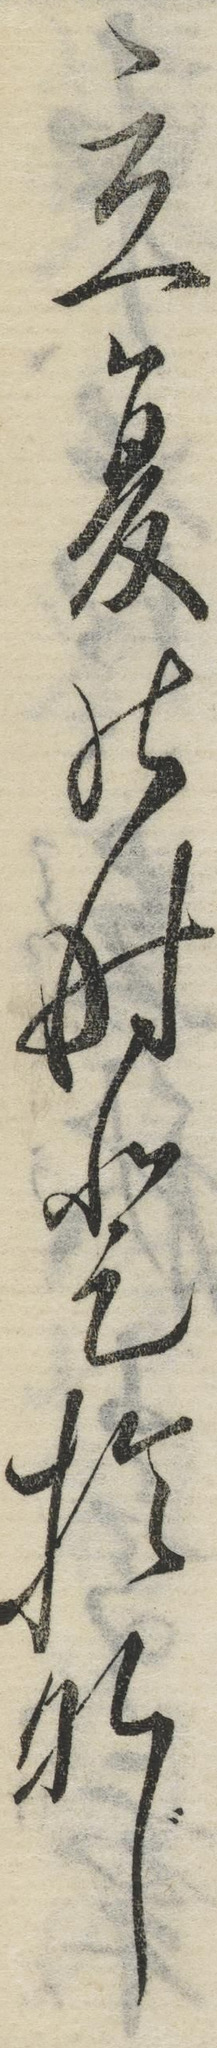立夏の時とおなじ

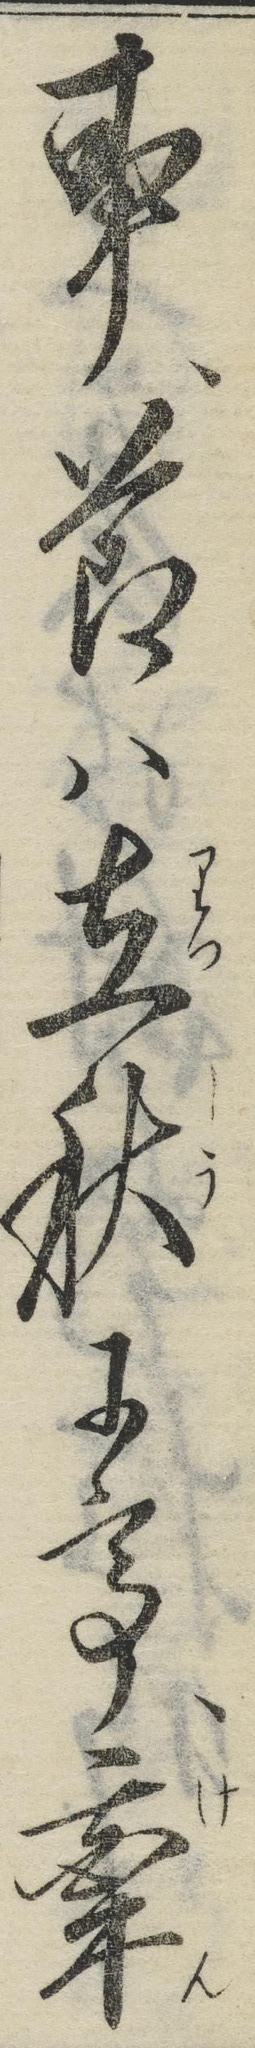事、節は立秋にて、牽
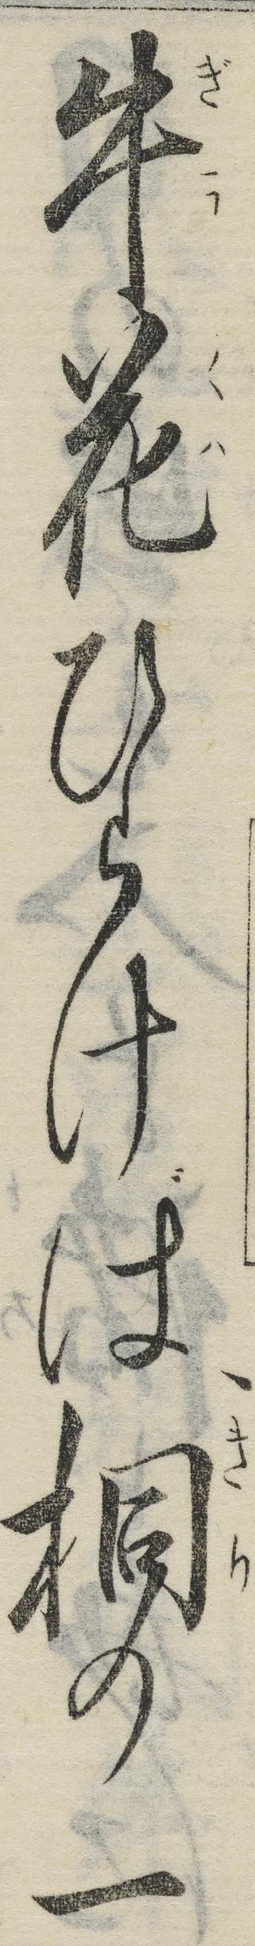牛花ひらけば、桐の一
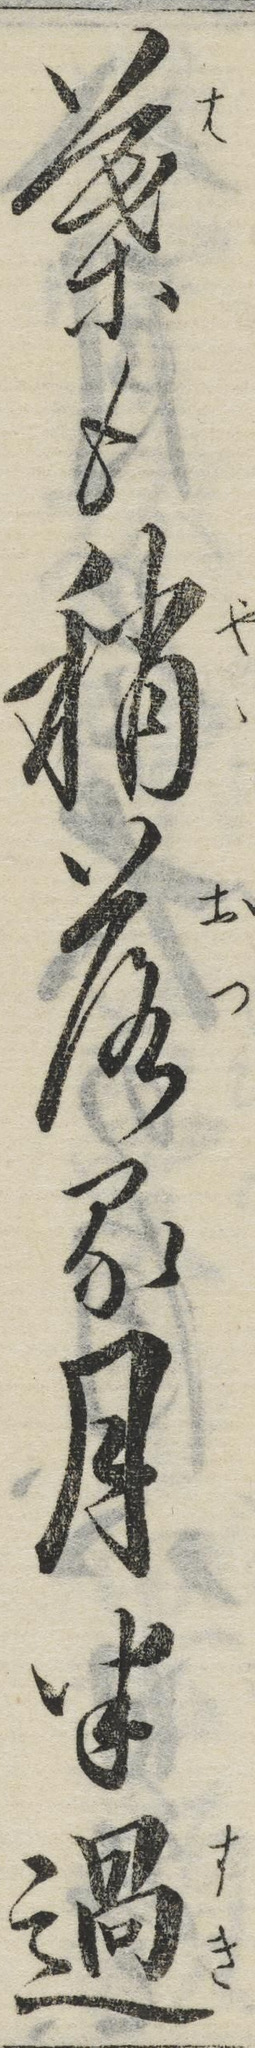葉も稍落る月半過
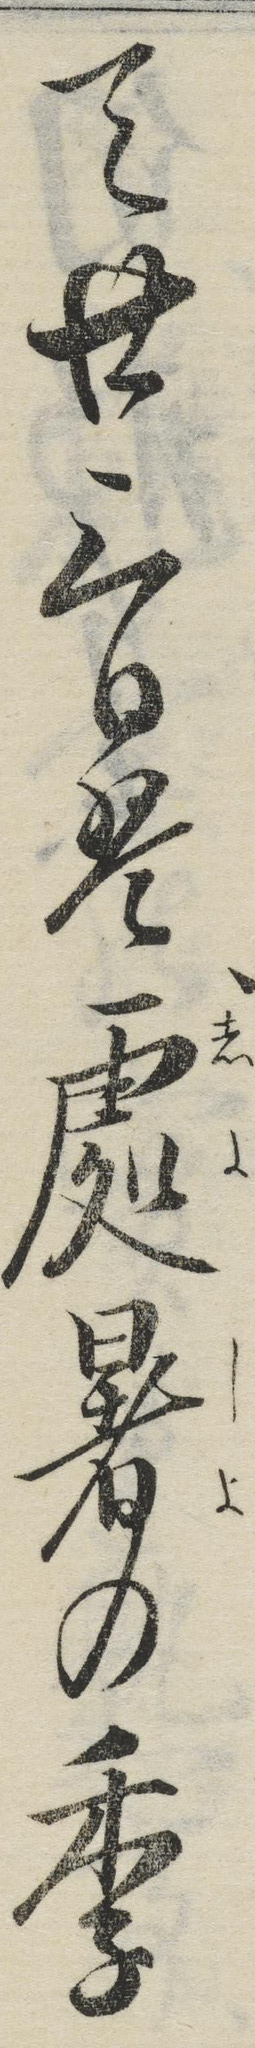て廿三日は、処暑の季
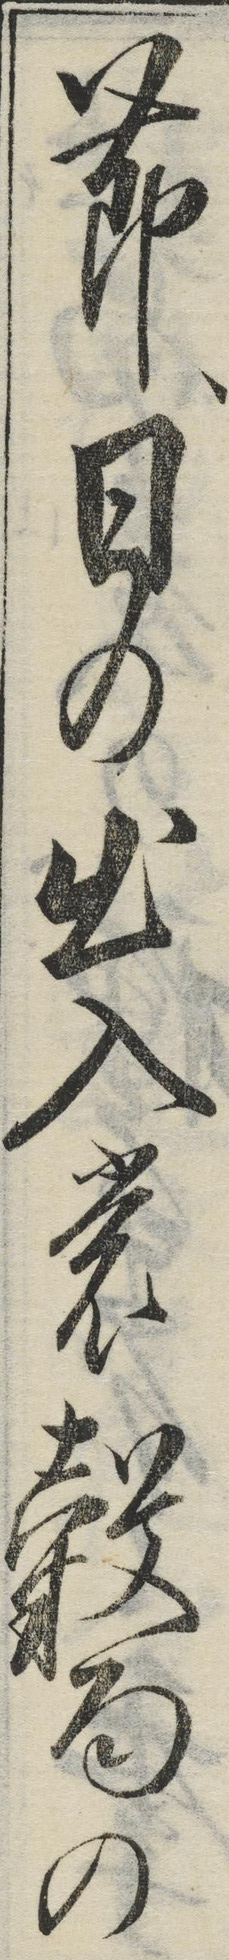節、日の出入も穀雨の
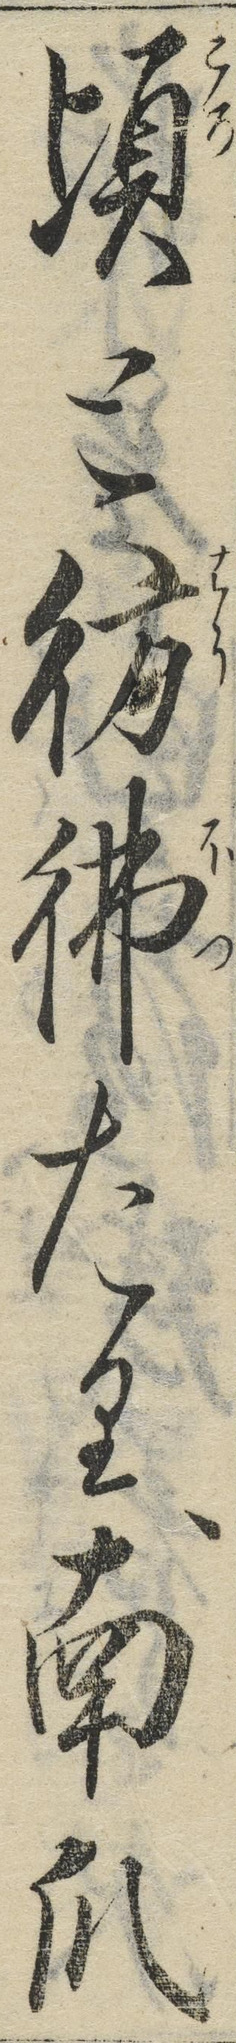頃と彷彿たり、南瓜
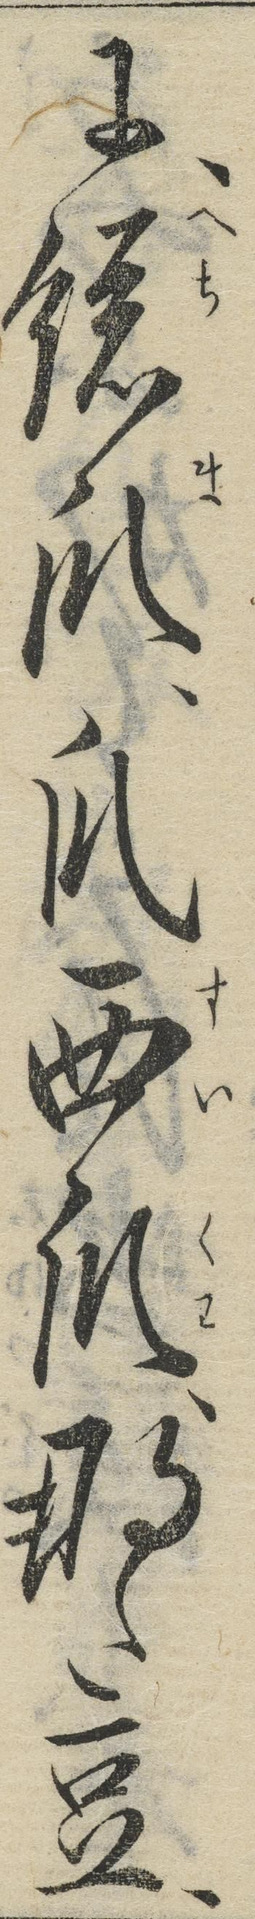に、絲瓜、瓜西瓜、なた豆
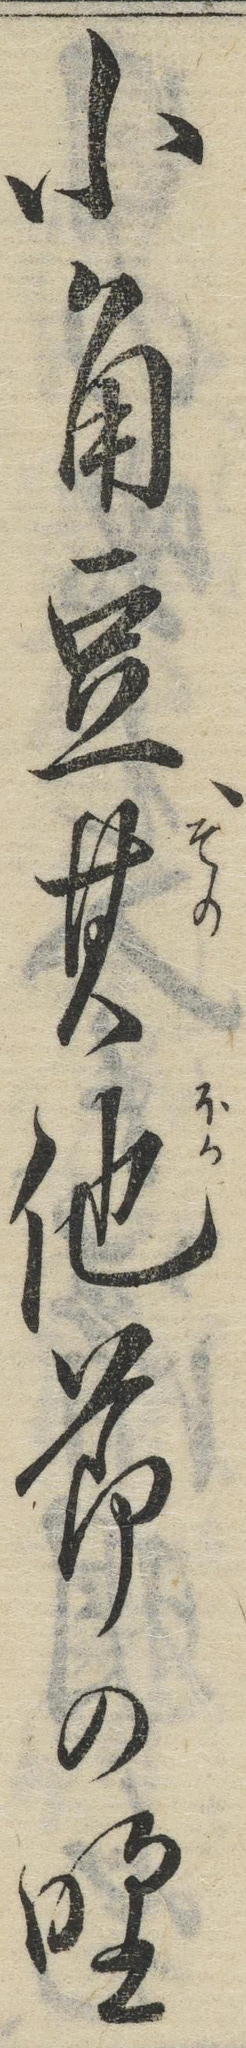小角豆、其他節の野
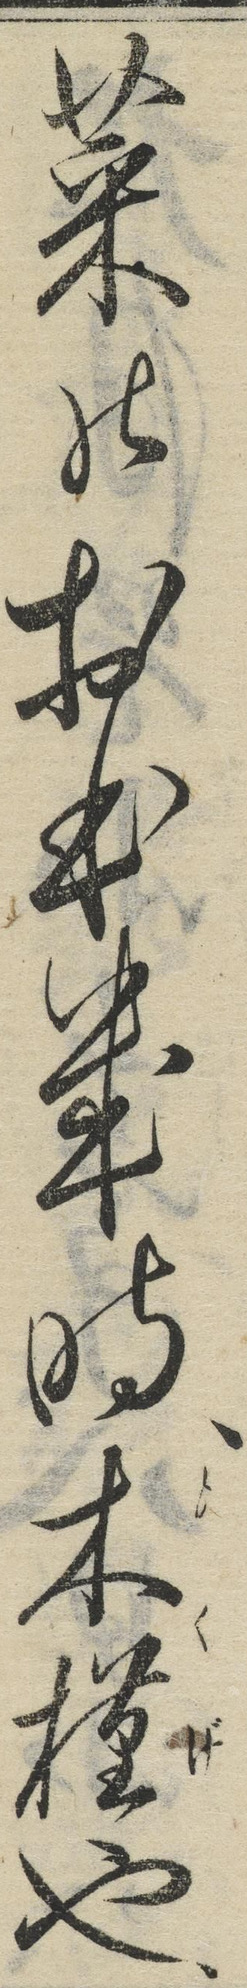菜のおほき時、木槿や、
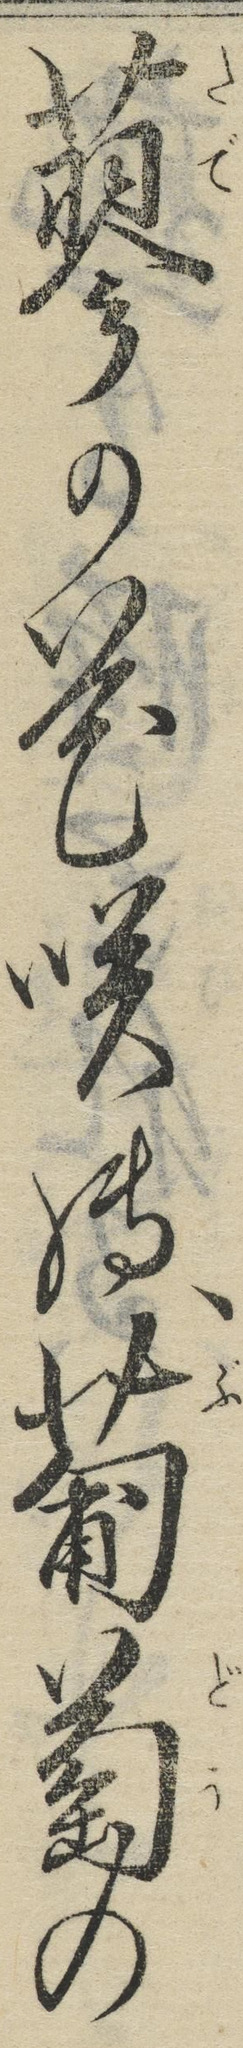蓼の花咲て、葡萄の

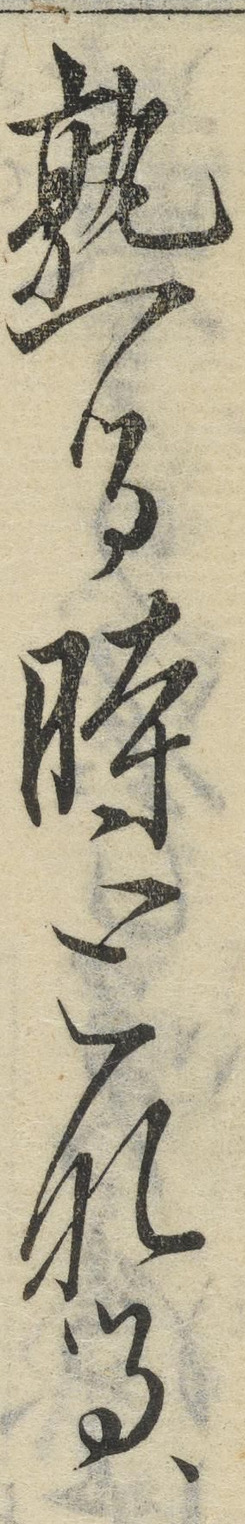熟る時となる、
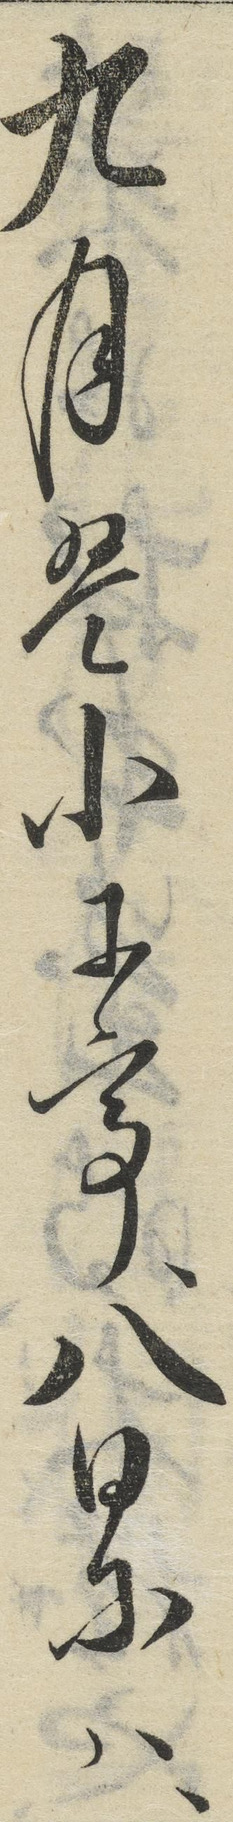九月は小にて、八日には、
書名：暦日往来　單
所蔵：東京大学地震研究所図書室 Earthquake Research Institute Library, The University of Tokyo, JAPAN
